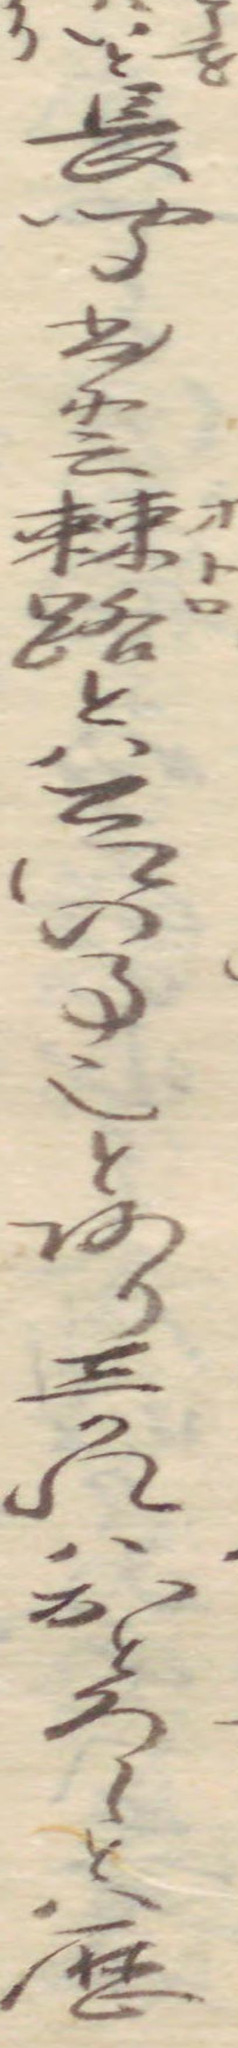長聞書に云棘路とは公卿の事也とありしかれはおとろしとは歴
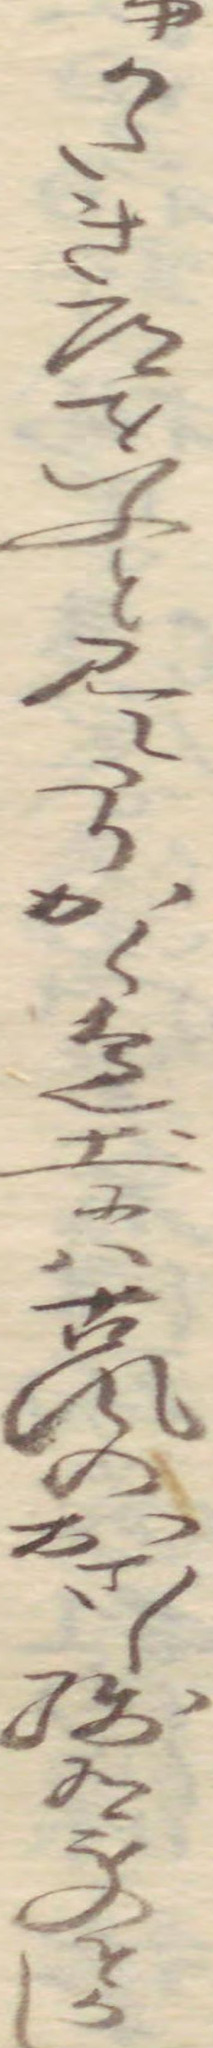かたき路をいふと見えたりかく辺土には古風のおさ〳〵残有ものそかし
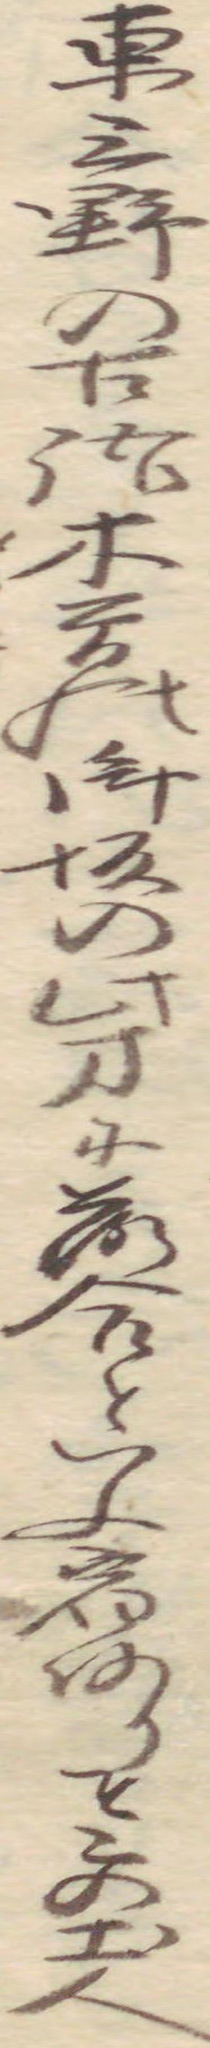東三野の古語木曽の御坂の此方に落合といふ宿ありそこの土人
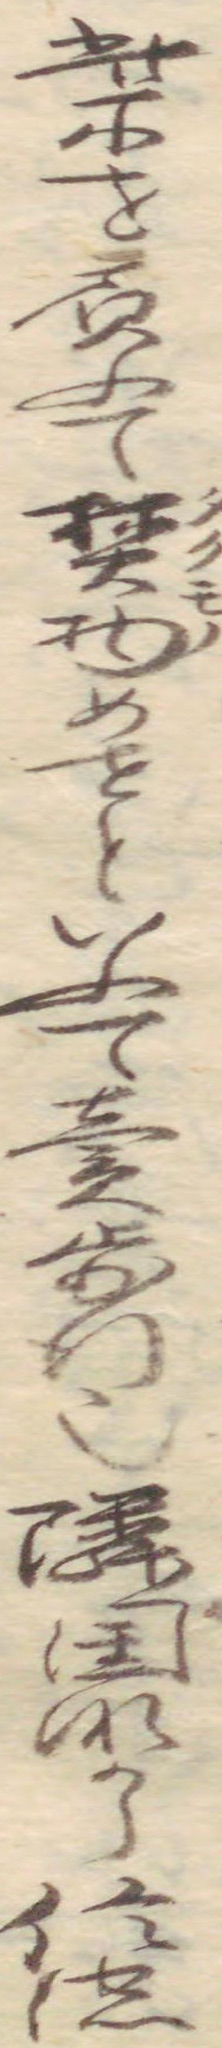柴を負ふて焚物めせといふて売歩行也隣国なから信濃
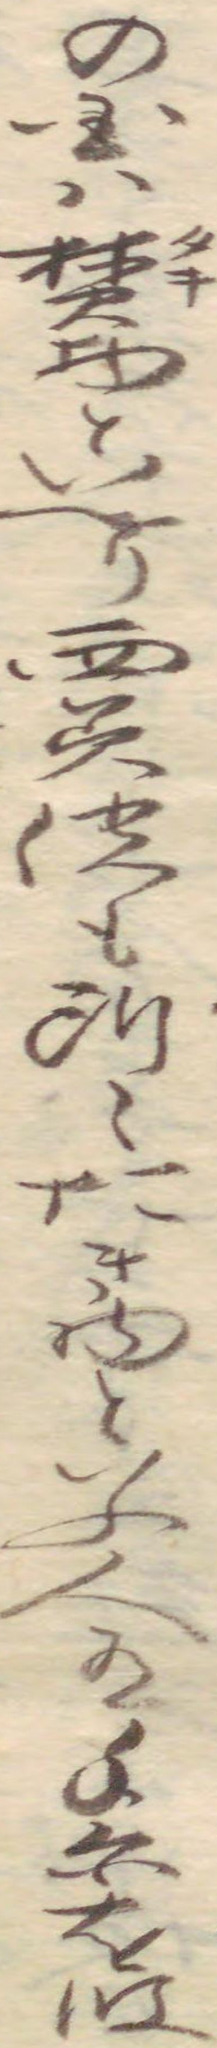の国は焚物といへり西美濃も所〻たき物といふ人有てにをは
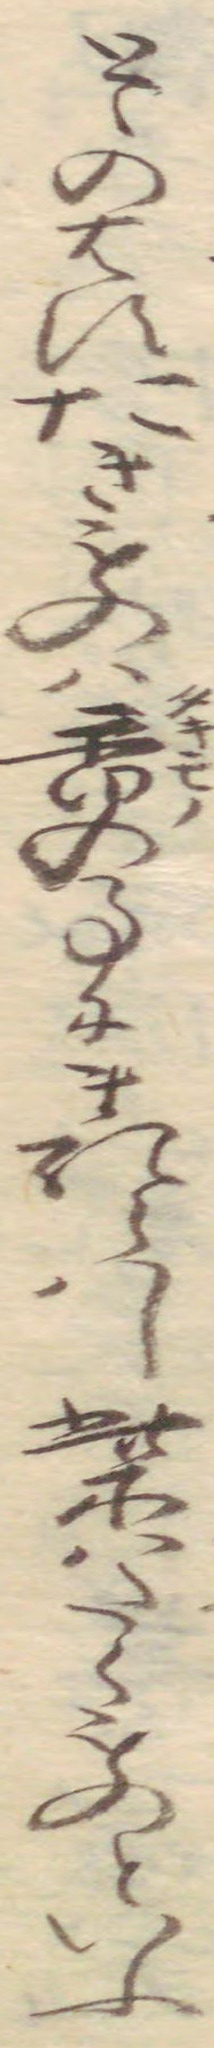とゝのはすたきものは香の事にまきらはし柴はたくものといふ
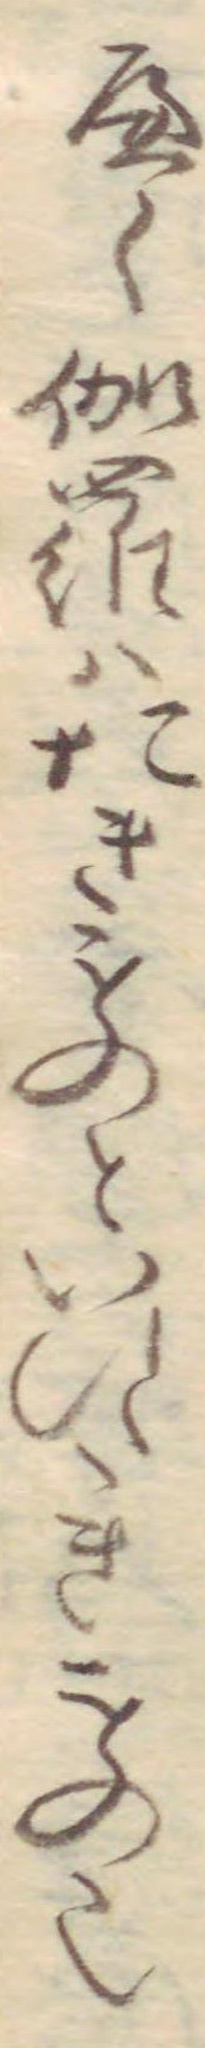へく伽羅はたきものといひたきもの也

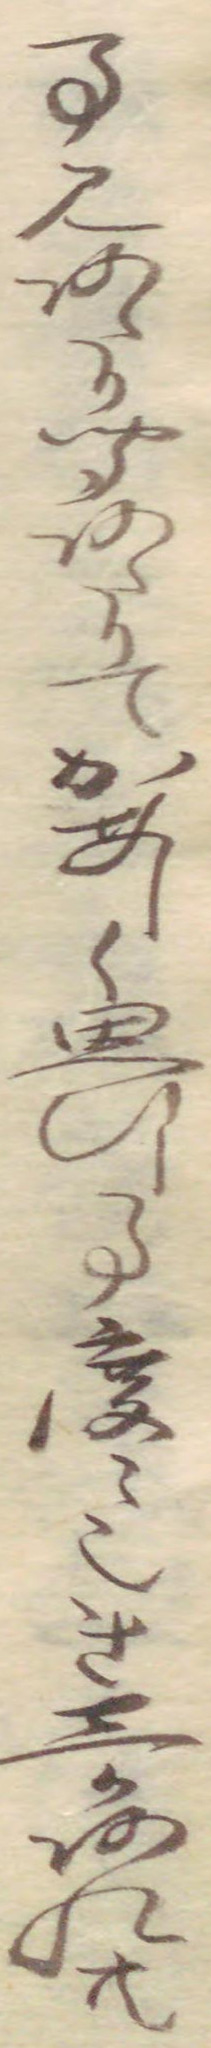事見あたり聞あたりてかなしく思ひし事度〻也きしかあれ共
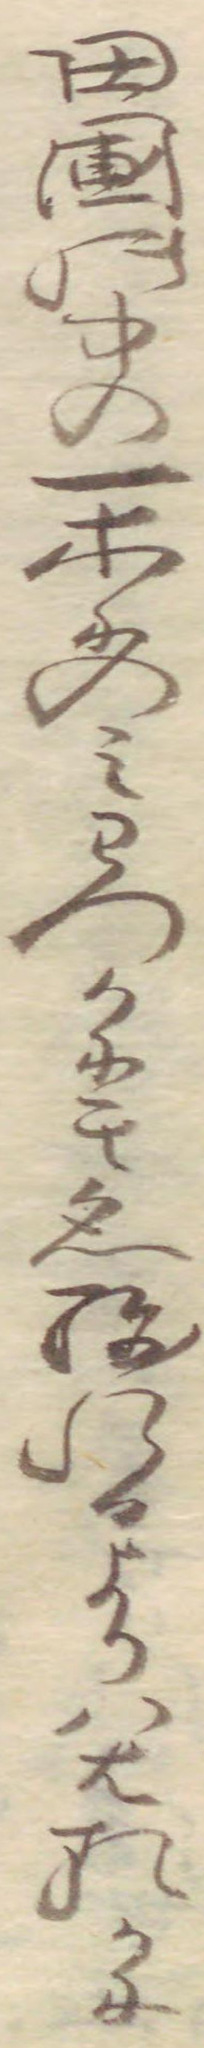田圃の中の一木にのみわつかに其名残れるよりはるかに
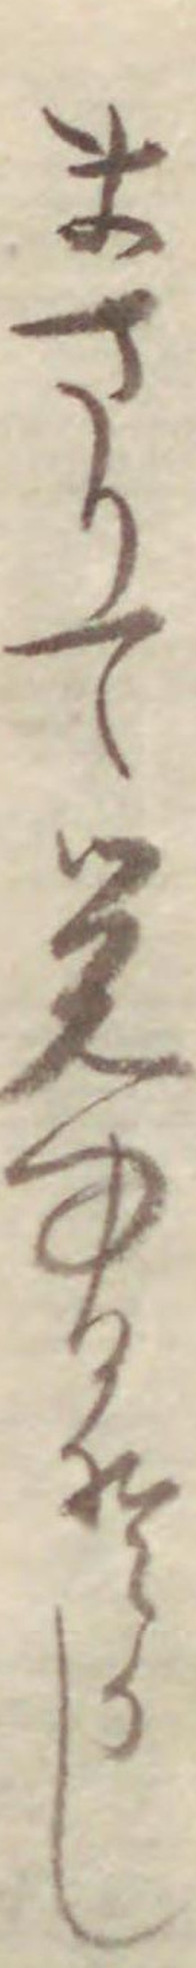まさりて覚ゆるそかし
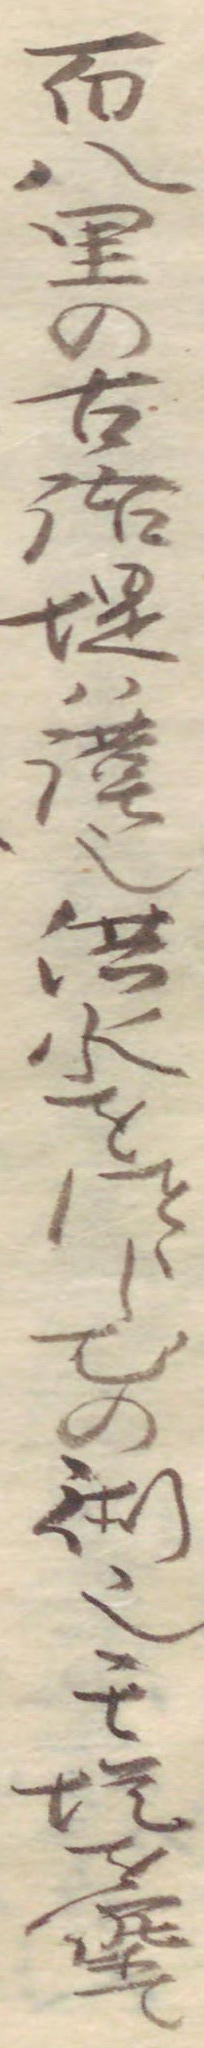百八里の古語？堤は謹也洪水をつゝしむの術也其堤を築？て
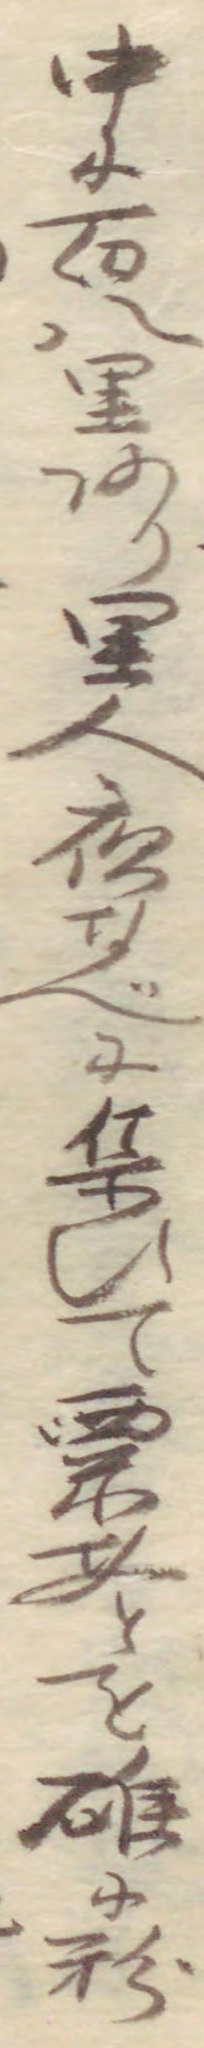中に百八里あり里人夜なべに集ひて粟なとを碓に粉
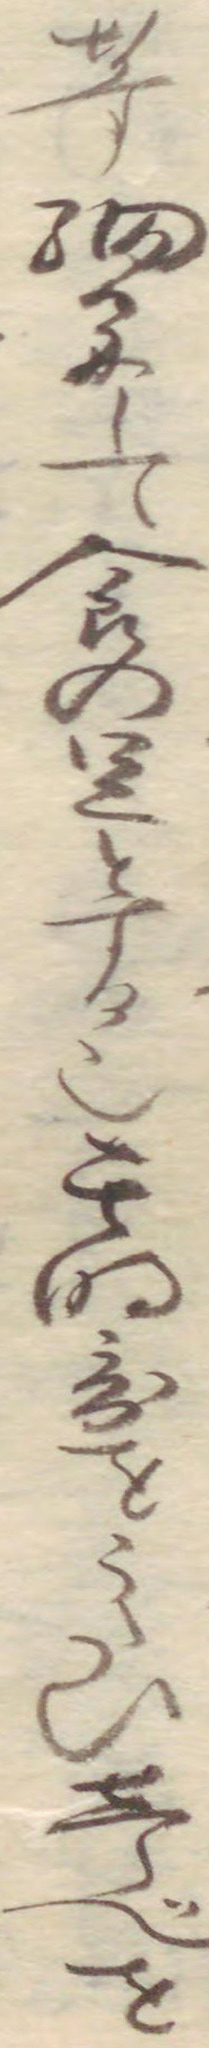なす細かにして食の足とする也其時歌をうたひしらべを
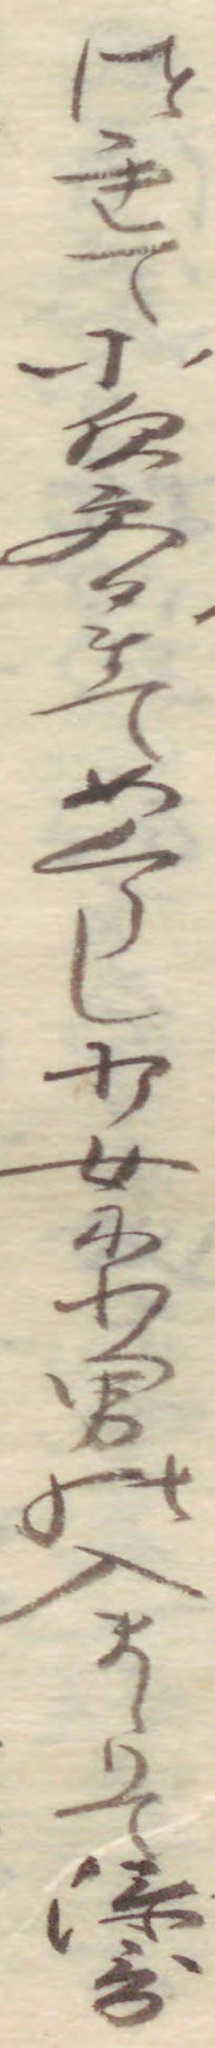つれて小夜更るまてめくらし少女に少男の入ましりて添歌
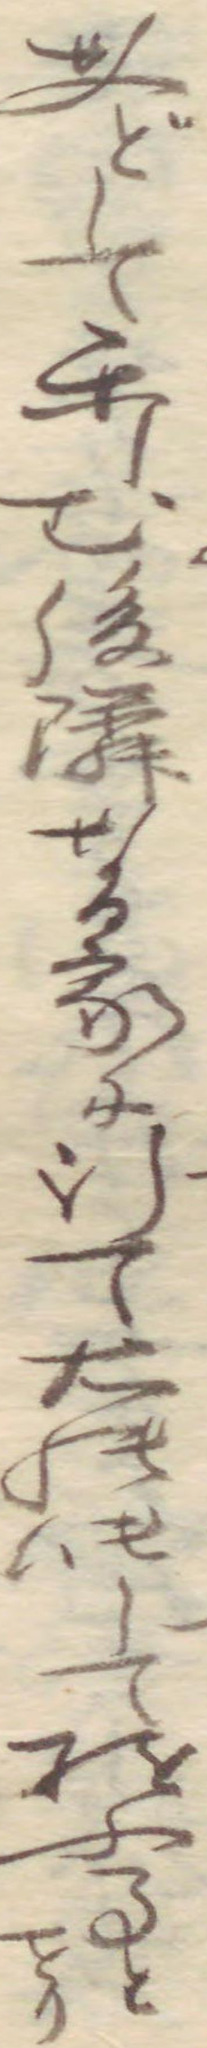などして楽しむ後隣なる家に行て右の咄して遊ふ事とせり
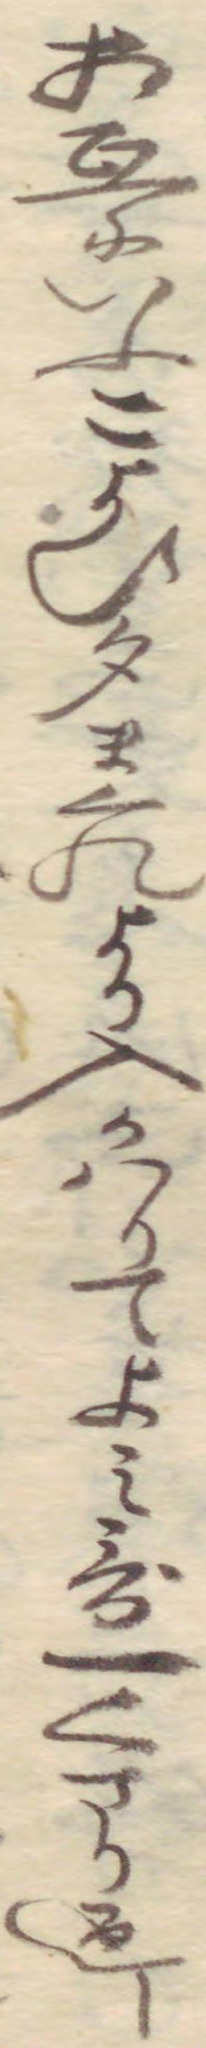相互にいふこよひ夕まくれより入かはりてよみ歌一くさり返し
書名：鶯宿雑記. 巻263-264
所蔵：国立国会図書館 National Diet Library, JAPAN
